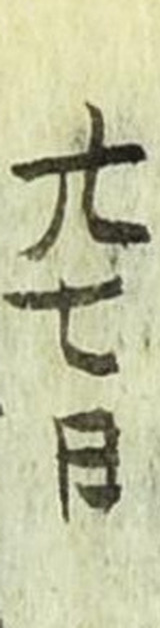廿七日
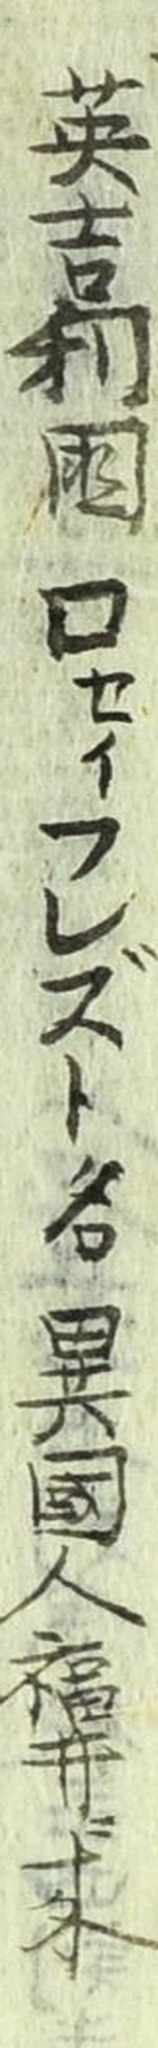英吉利国ロセイフレズト名異国人福井ニ来
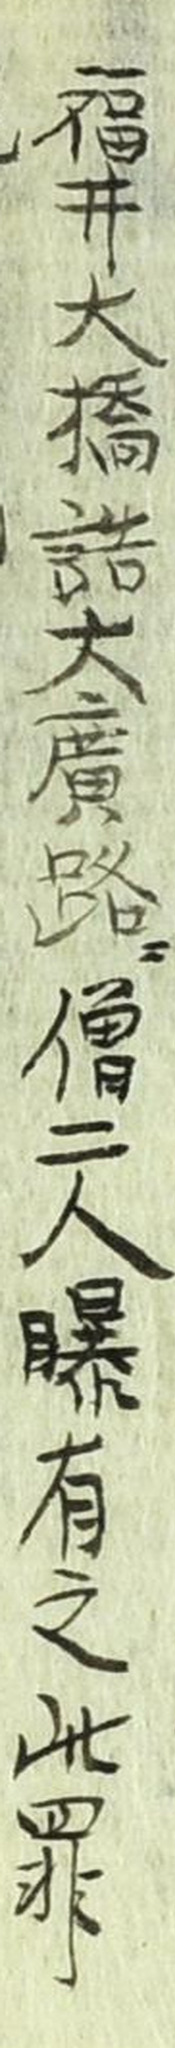福井大橋詰大広路ニ僧二人曝有之此罪
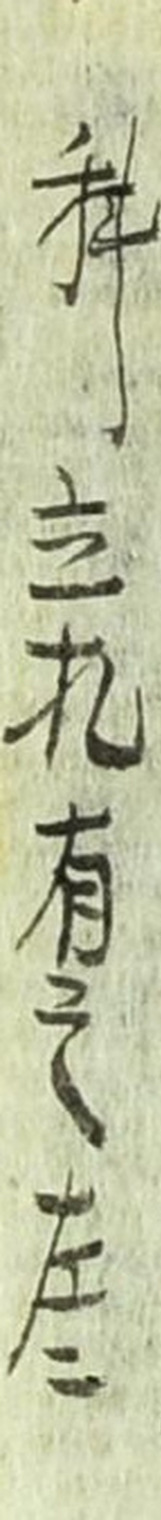科立札有之左に
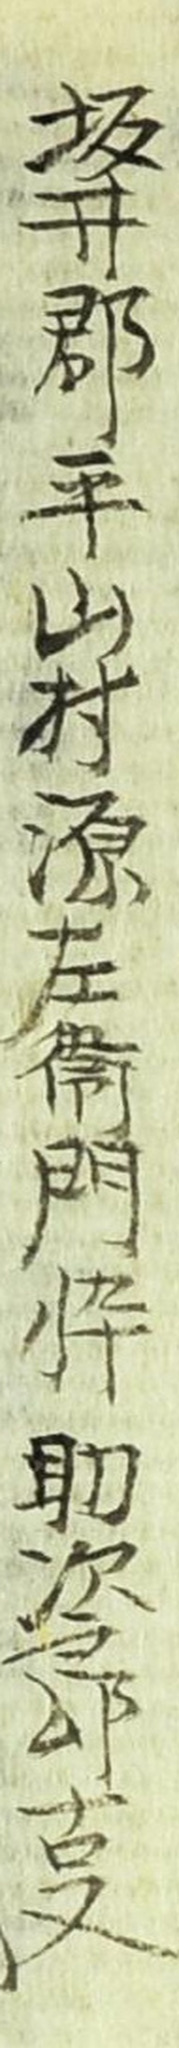坂井郡平山村源左衛門倅助次郎事
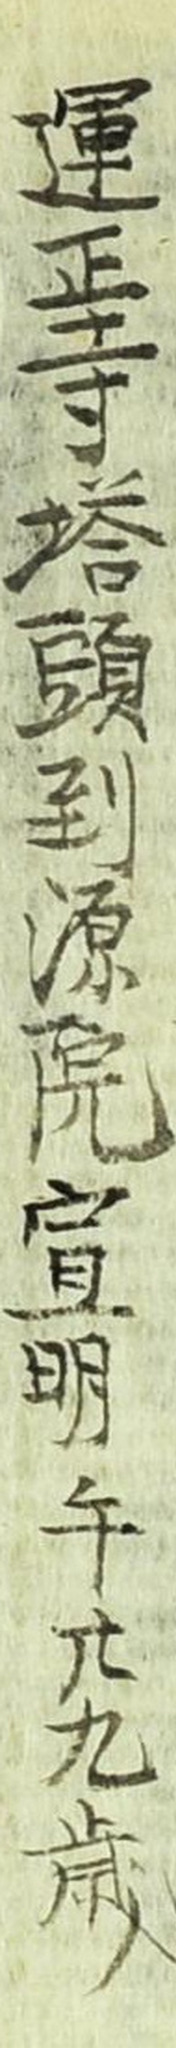運正寺塔頭到源院宣明午廿九歳
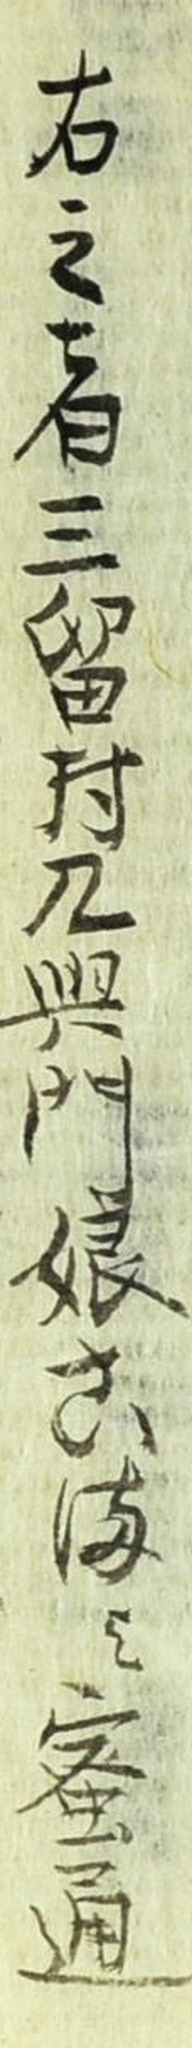右之者三留村九与門娘こま与密通
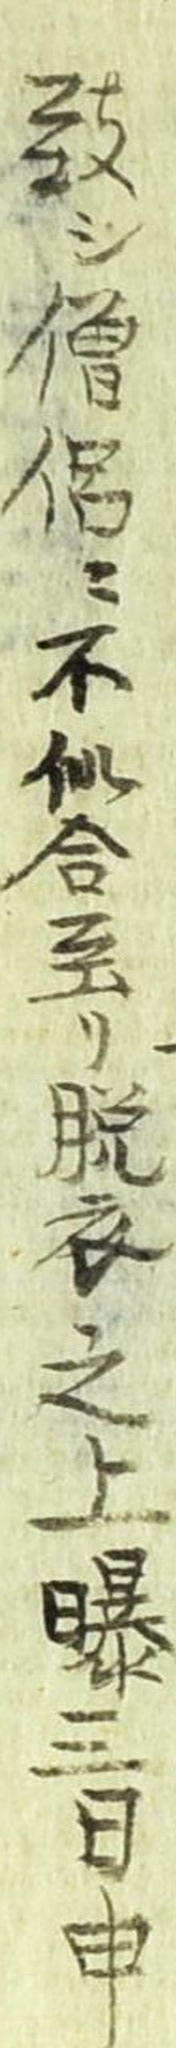致シ僧侶ニ不似合至リ脱衣之上曝三日申
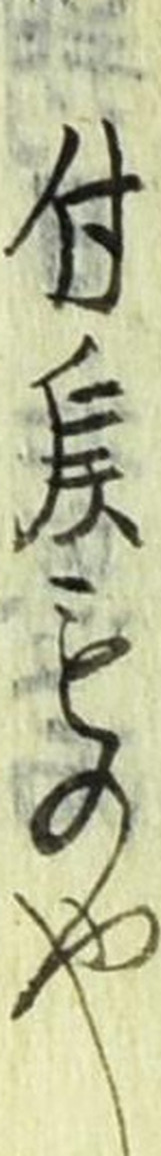付候もの也

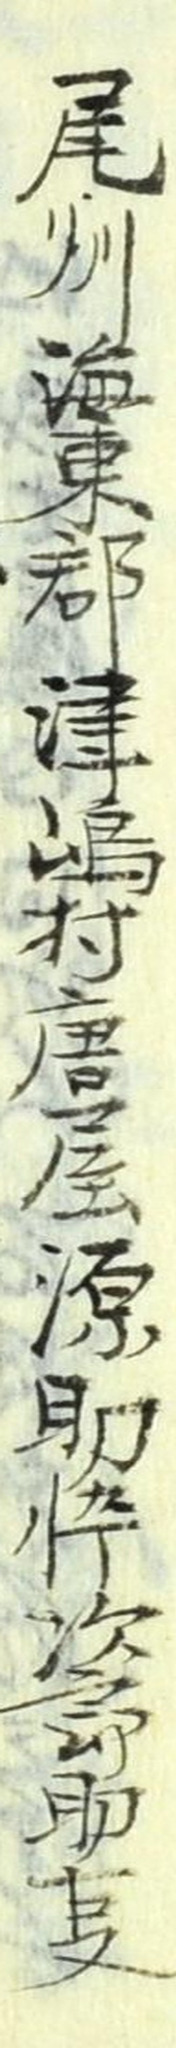尾州海東郡津島村唐屋源助倅次郎助事
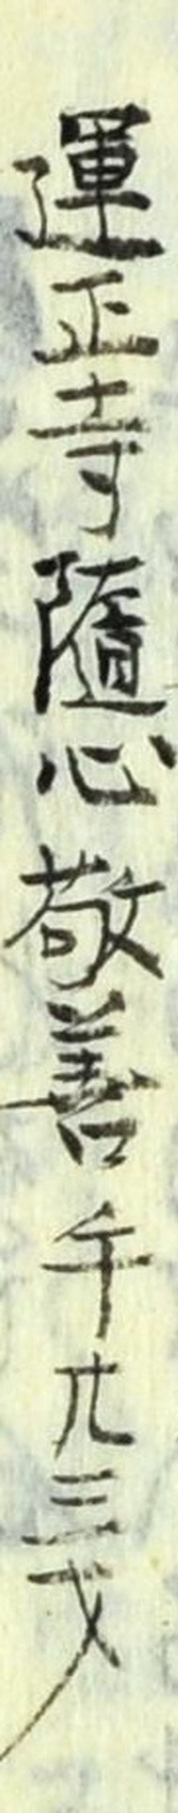運正寺随心敬善午廿三歳
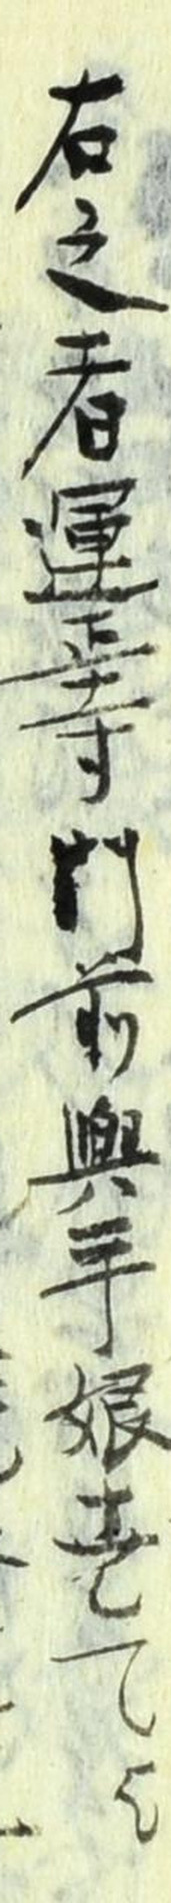右之者運正寺門前与平娘すて与
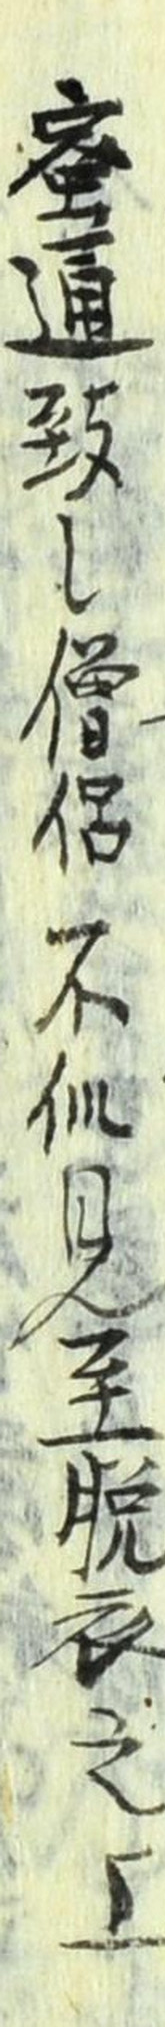蜜通致し僧侶不似見至脱衣之上
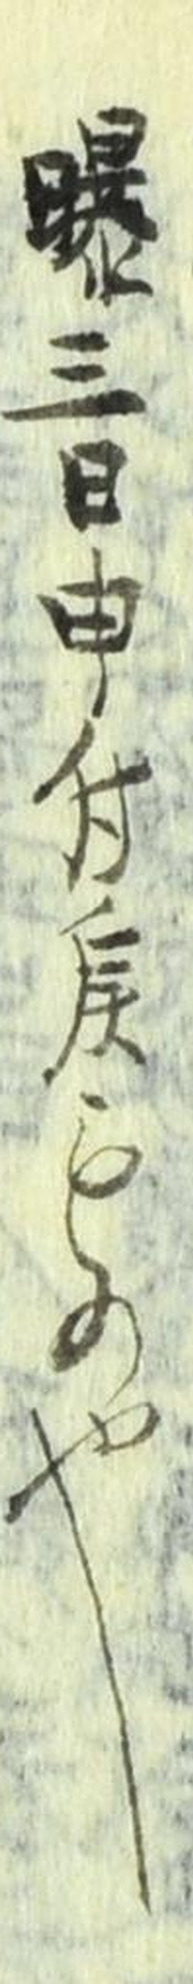曝三日申付候もの也
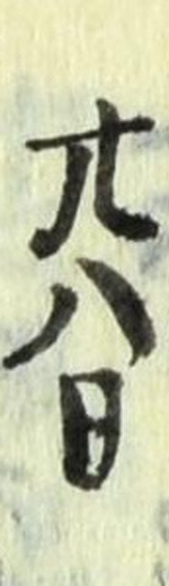廿八日
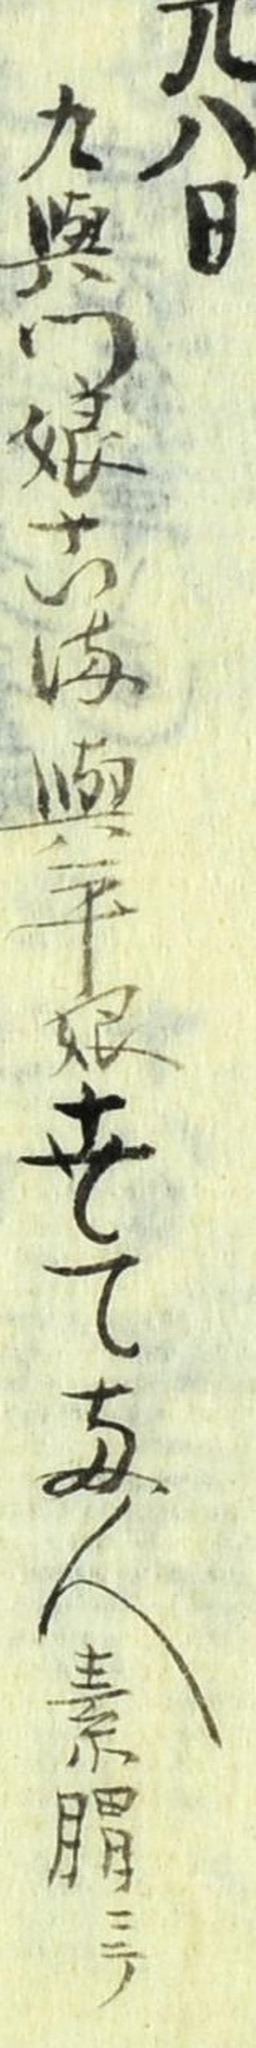九与門娘こま与平娘すて両人素䁌ニテ
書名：（日記）
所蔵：福井県文書館 Fukui Prefectural Archives
